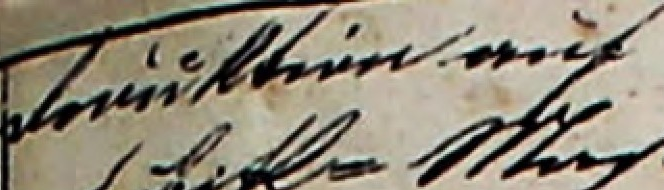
Reduktion auf
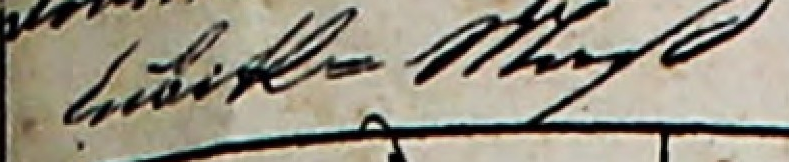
Cubik= Maß
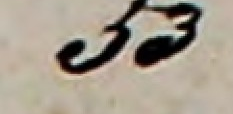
53
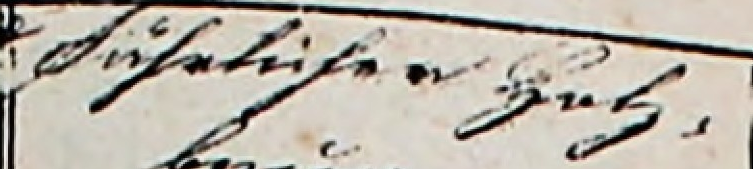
Jährlicher Holz„
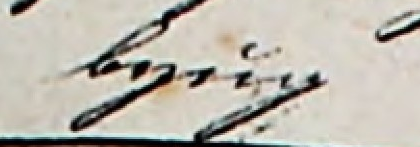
bezug
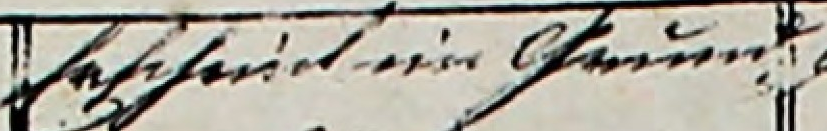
Erscheint im Grund„
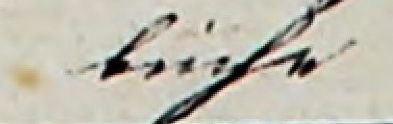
buche
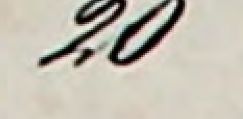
20
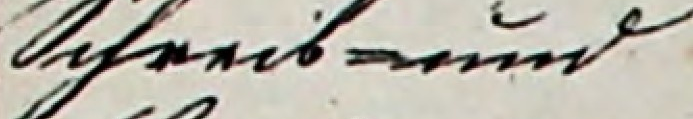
Schreib = und
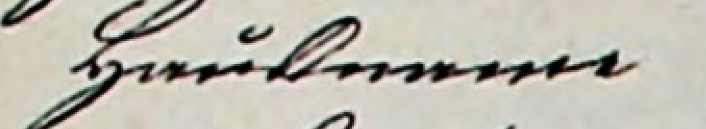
Hausmann
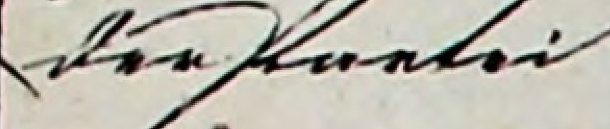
der Partei
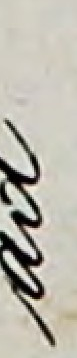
ad
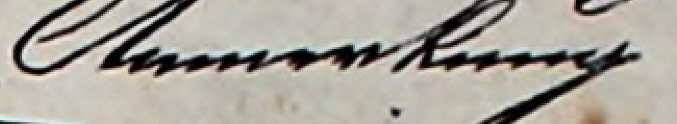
Anmerkung
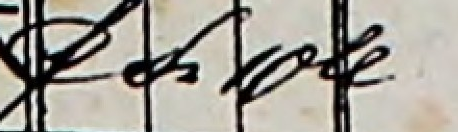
???
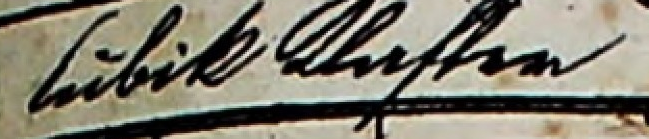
Cubik Klafter
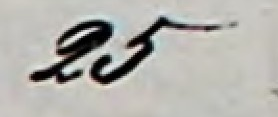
25
